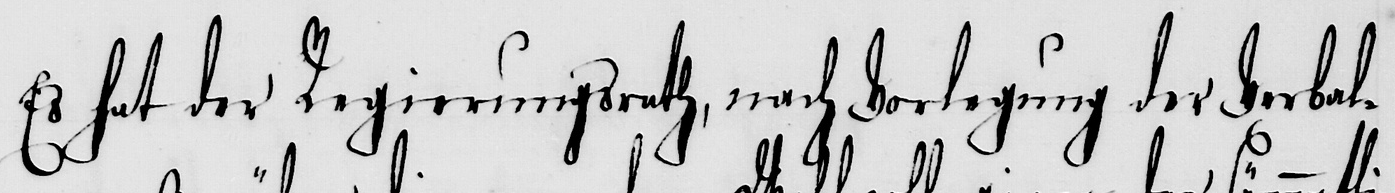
Es hat der Regierungsrath, nach Vorlegung der Verbal¬
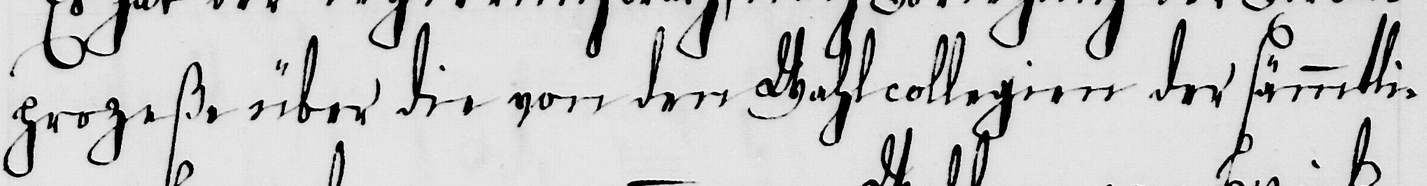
prozeße über die von den Wahlcollegien der sämmtli¬
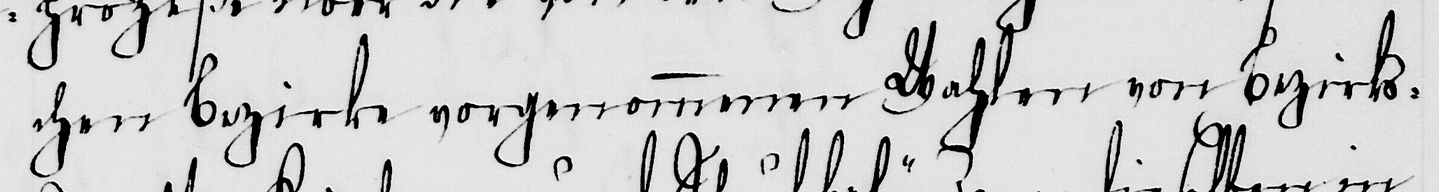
chen Bezirke vorgenommenen Wahlen von Bezirks-
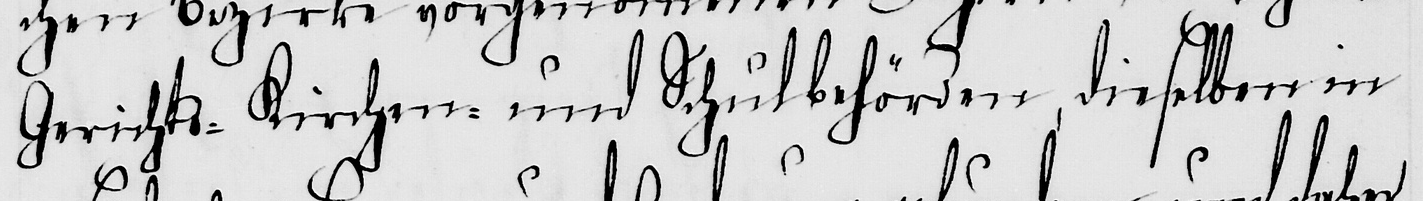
Gerichts- Kirchen- und Schulbehörden, dieselben in
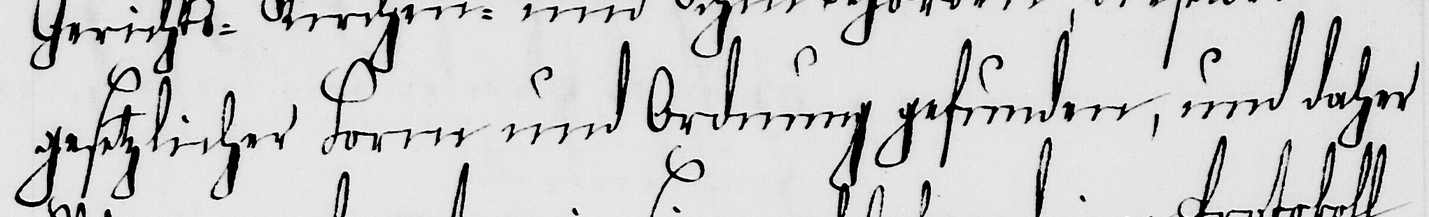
gesetzlicher Form und Ordnung gefunden, und daher
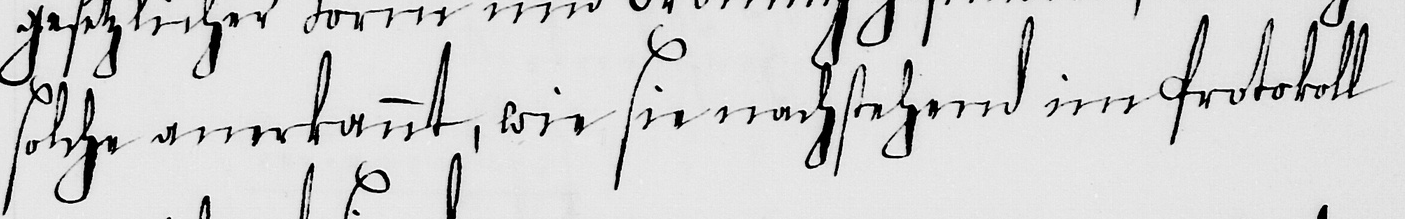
solche anerkannt, wie sie nachstehend im Protokoll
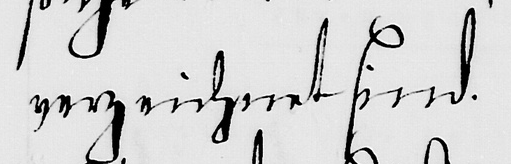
verzeichnet sind.
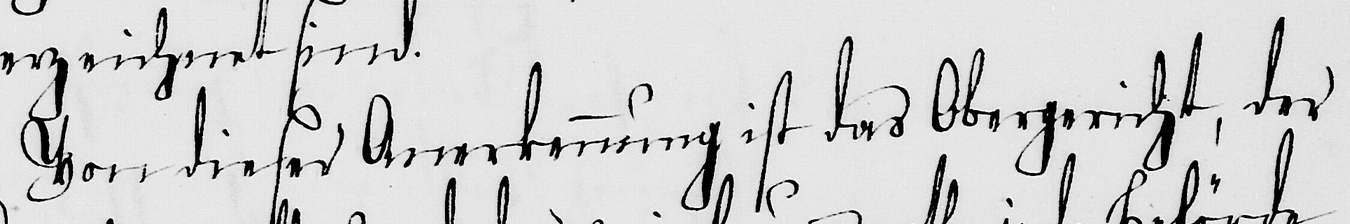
Von dieser Anerkennung ist das Obergericht, der
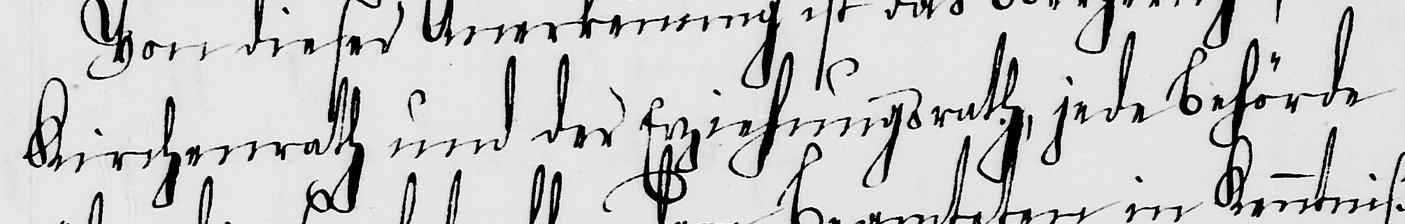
Kirchenrath und der Erziehungsrath, jede Behörde
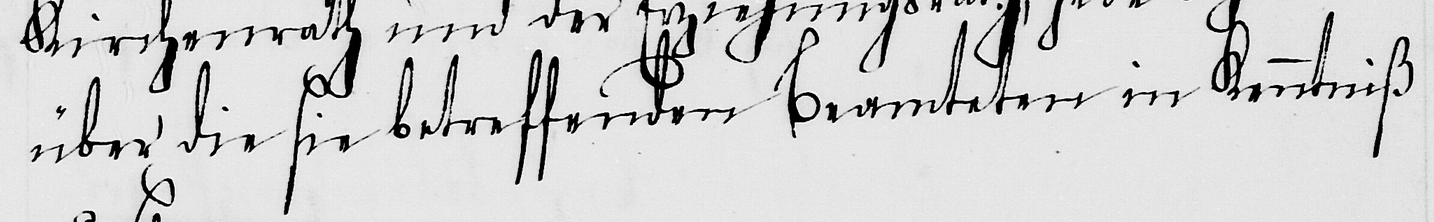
über die sie betreffenden Beamteten in Kenntniß
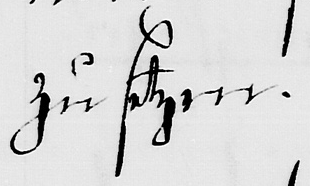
zu setzen.
